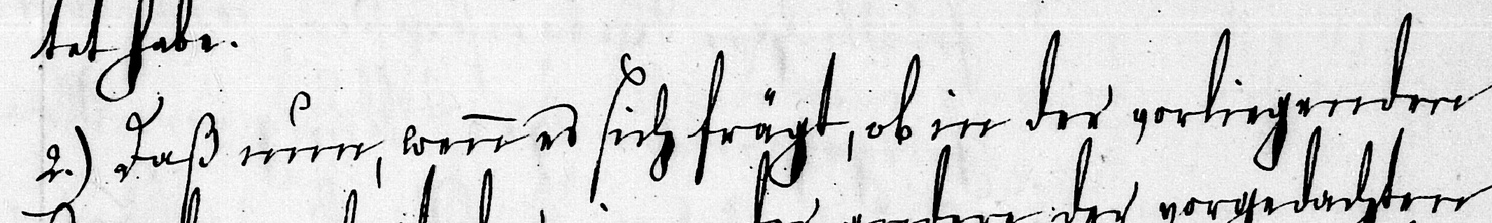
2.) Daß nun, wenn es sich frägt, ob in der vorliegenden
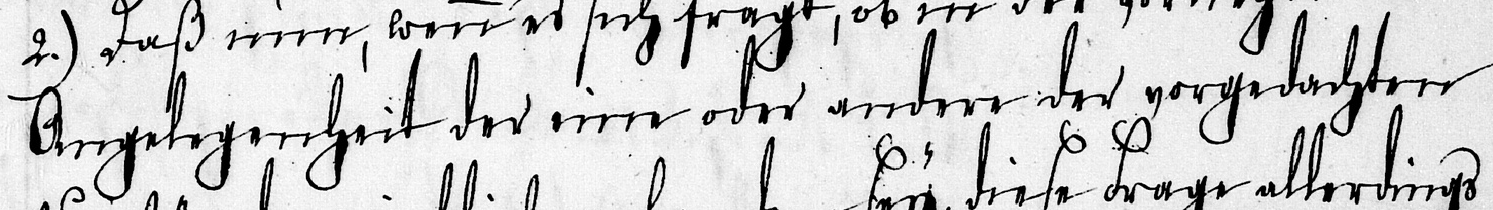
Angelegenheit der eine oder andere der vorgedachten
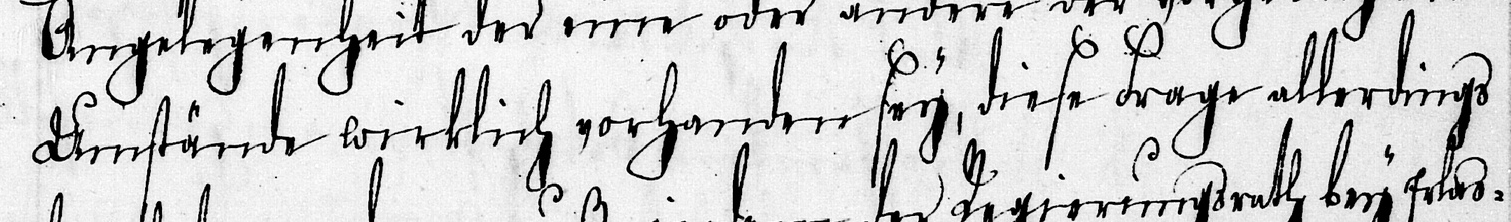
Umstände wirklich vorhanden sey, diese Frage allerdings
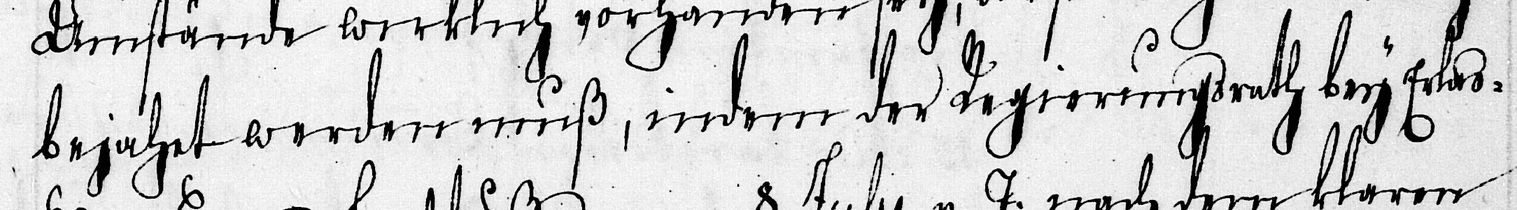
bejahet werden muß, indem der Regierungsrath bey Erlaß¬
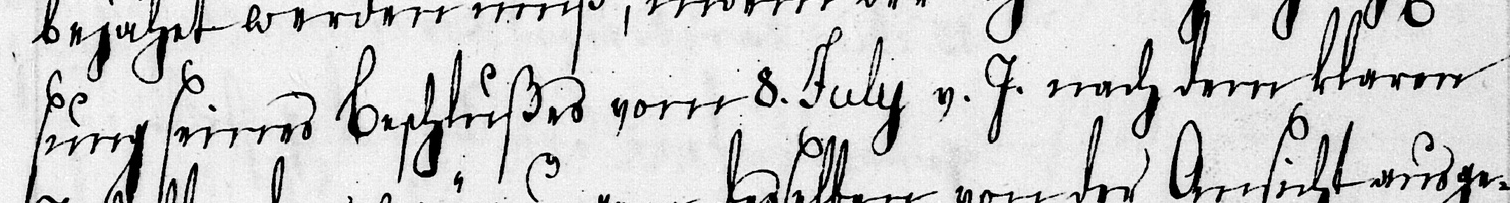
ung seines Beschlußes vom 8. July v. J. nach dem klaren
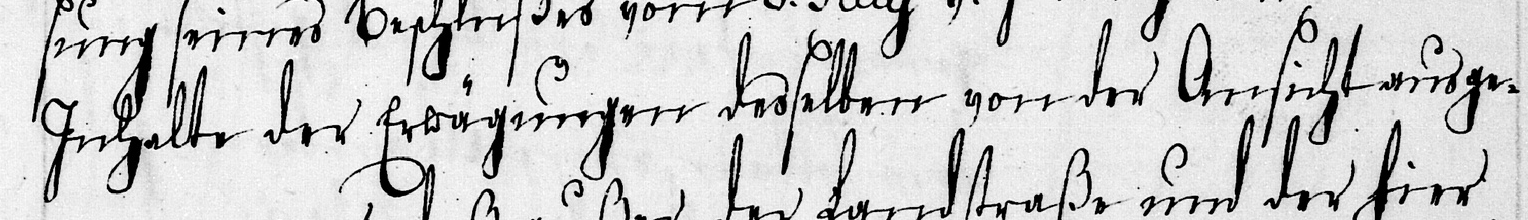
Inhalte der Erwägungen desselben von der Ansicht ausge¬
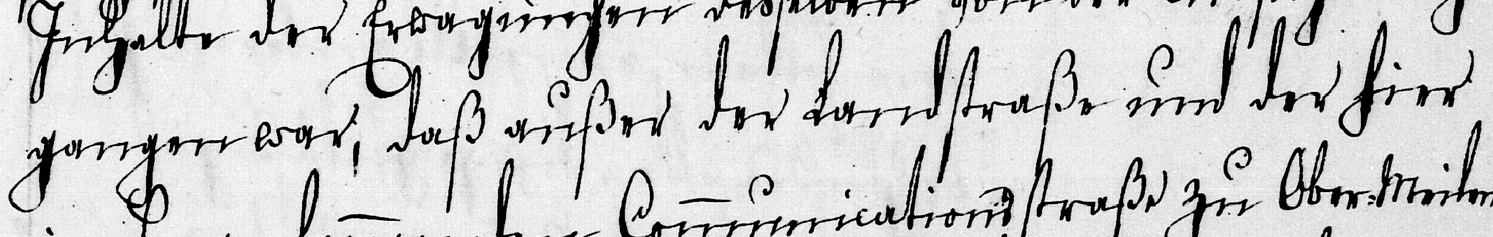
gangen war, daß außer der Landstraße und der hier
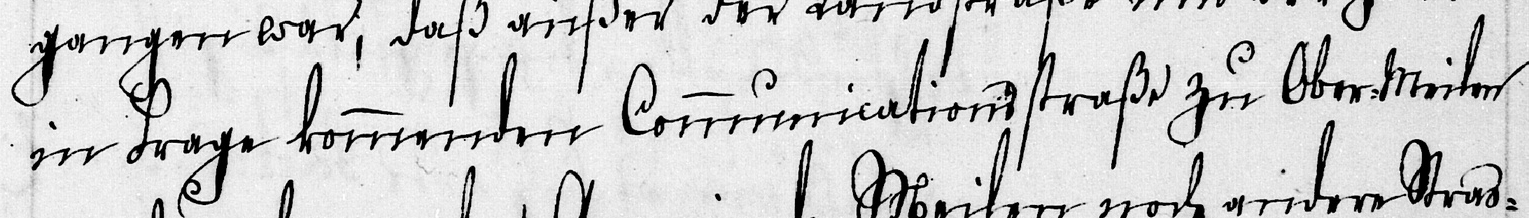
in Frage kommenden Communicationsstraße zu Ober-Meilen
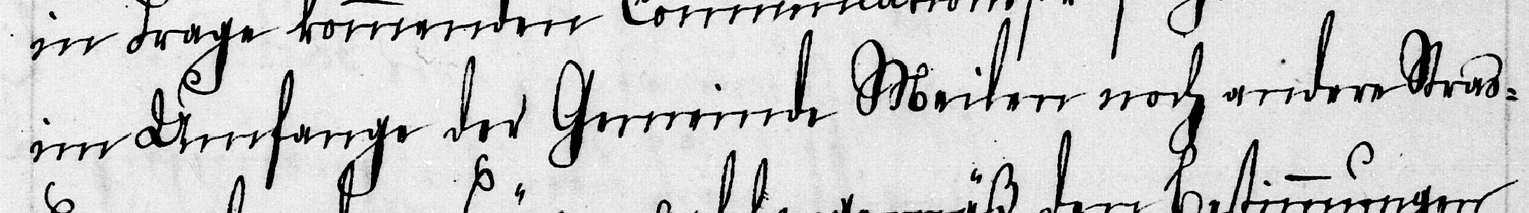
im Umfange der Gemeinde Meilen noch andere Straß¬
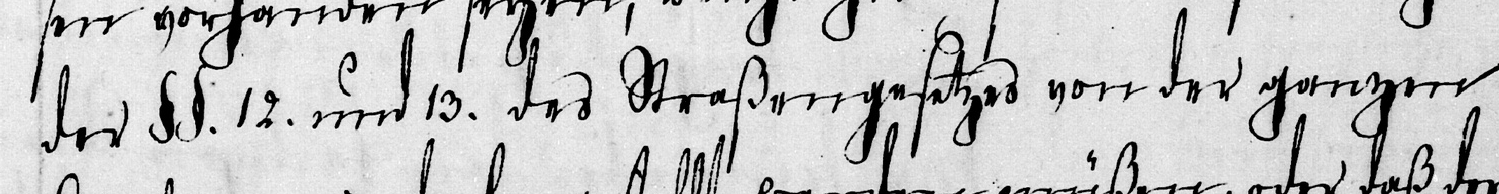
der §. §.12. und 13. des Straßengesetzes von der ganzen
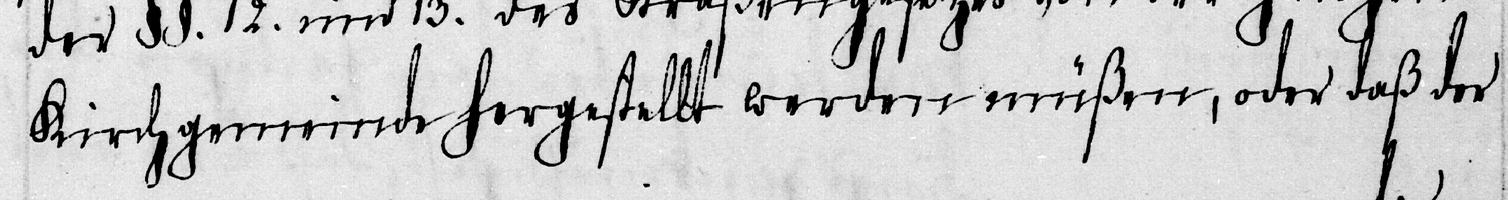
Kirchgemeinde hergestellt werden müßen, oder daß der
